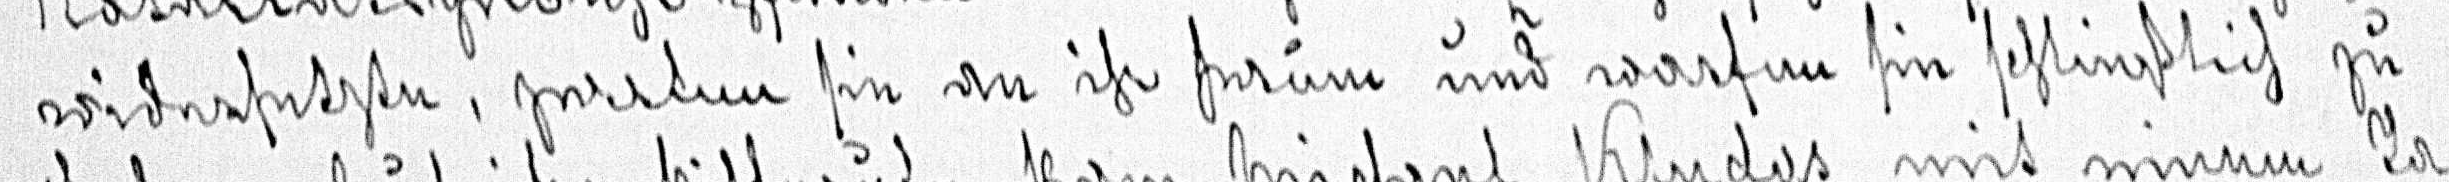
widersetzte, zerrten sie an ihr herum und warfen sie schließlich zu
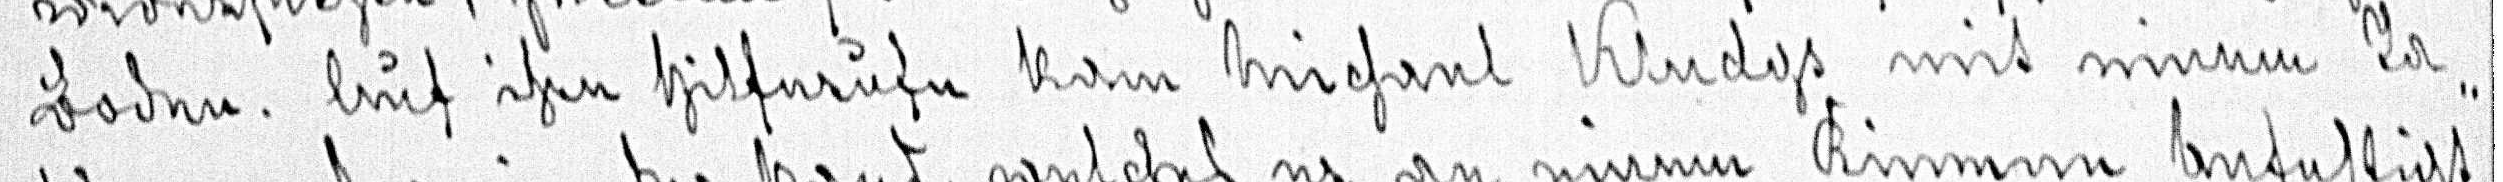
Boden. Auf ihre Hilferufe kam Michael Kludys mit einem Ta¬
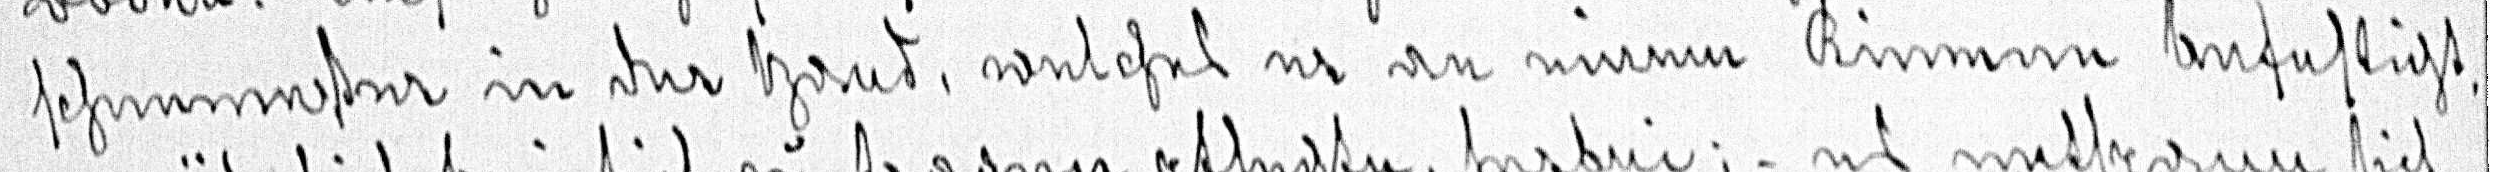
schenmesser in er Hand, welches er an einem Riemen befestigt,
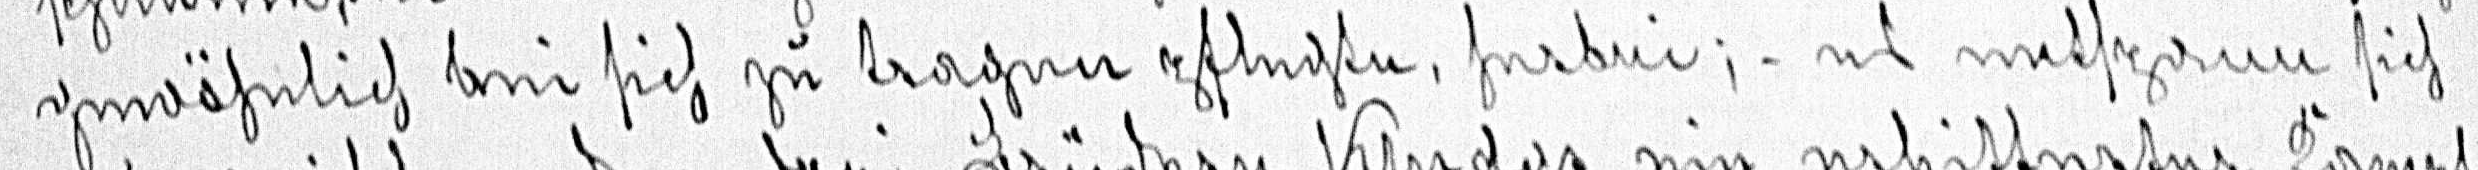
gewöhnlich bei sich zu tragen pflegte, herbei; – es entspann sich
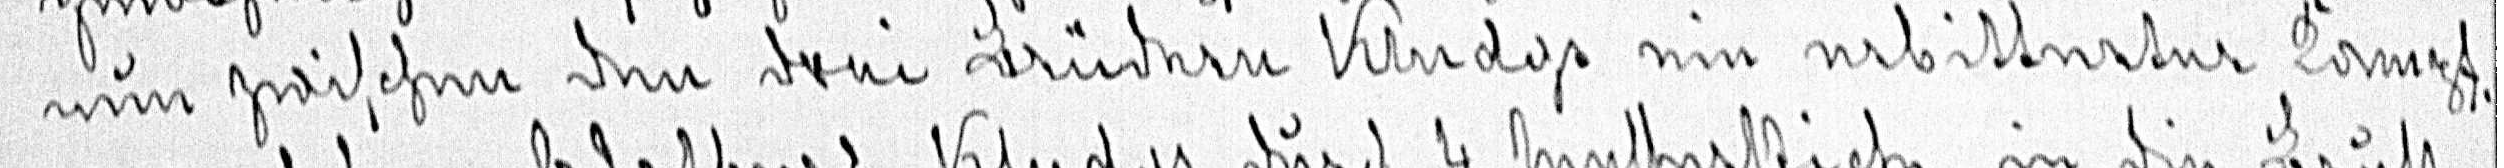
nun zwischen den drei Brüder Kundys ein erbitterter Kampf
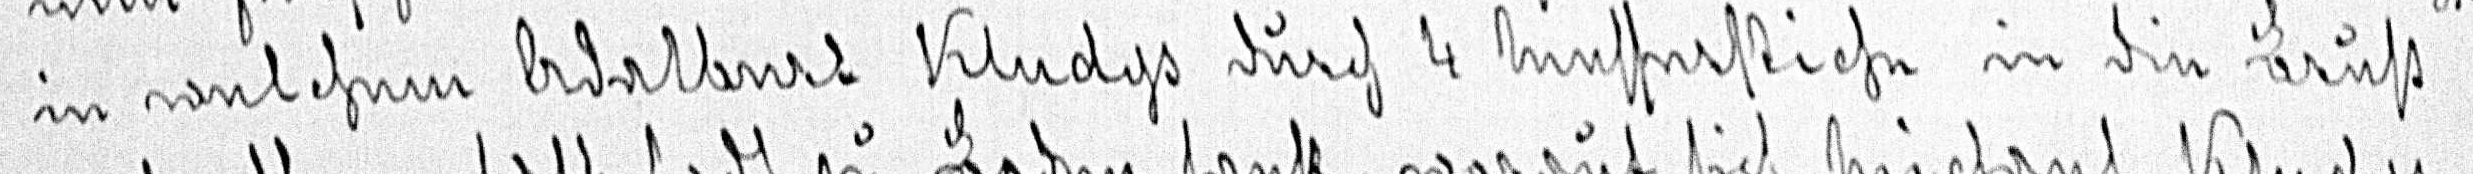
in welchem Adalbert Kludys durch 4 Messerstiche in die Brust
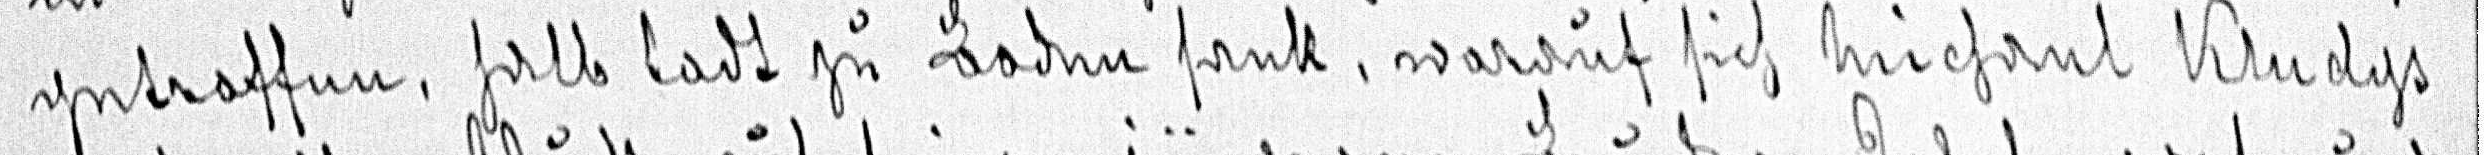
getroffen, halb todt zu Boden sank, worauf sich Michael Kludys
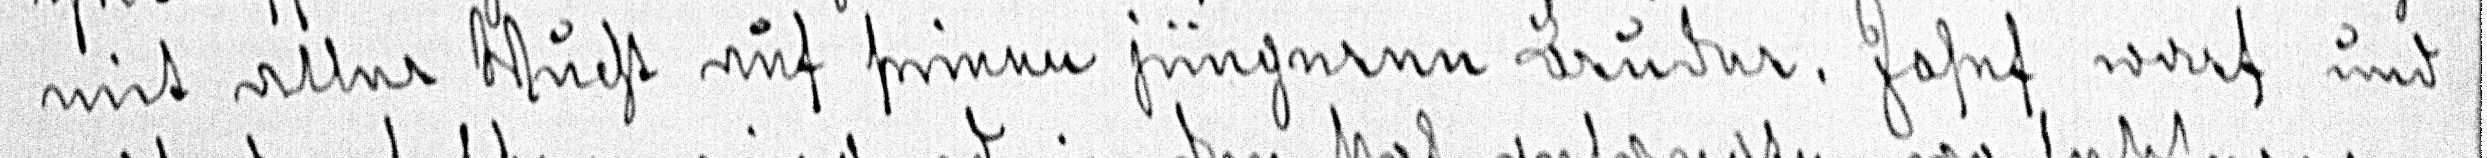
mit aller Wucht auf seinen jüngeren Bruder, Josef warf und
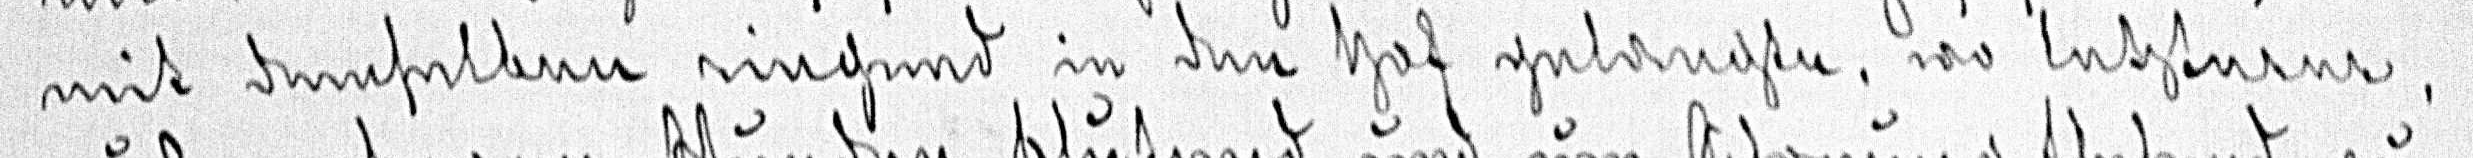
mit demselben ringend in den Hof belangte, wo letzterer,
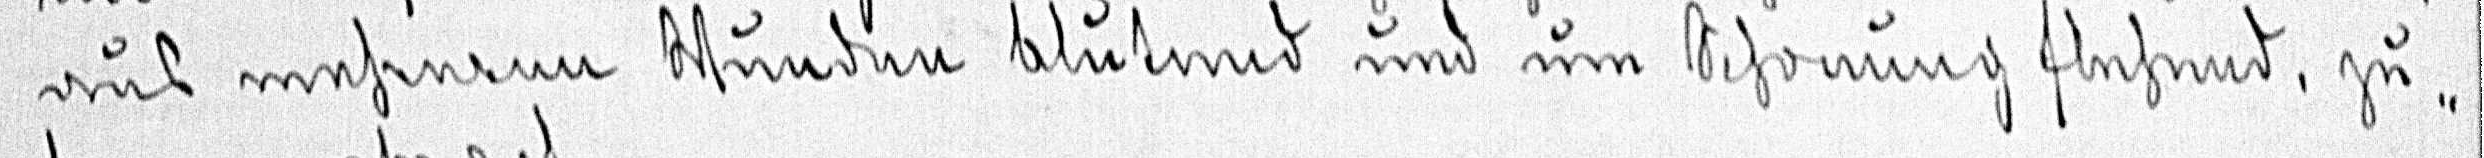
aus mehreren Wunden blutend und um Schonung flehend, zu¬
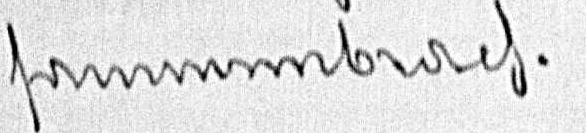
sammenbrach.
